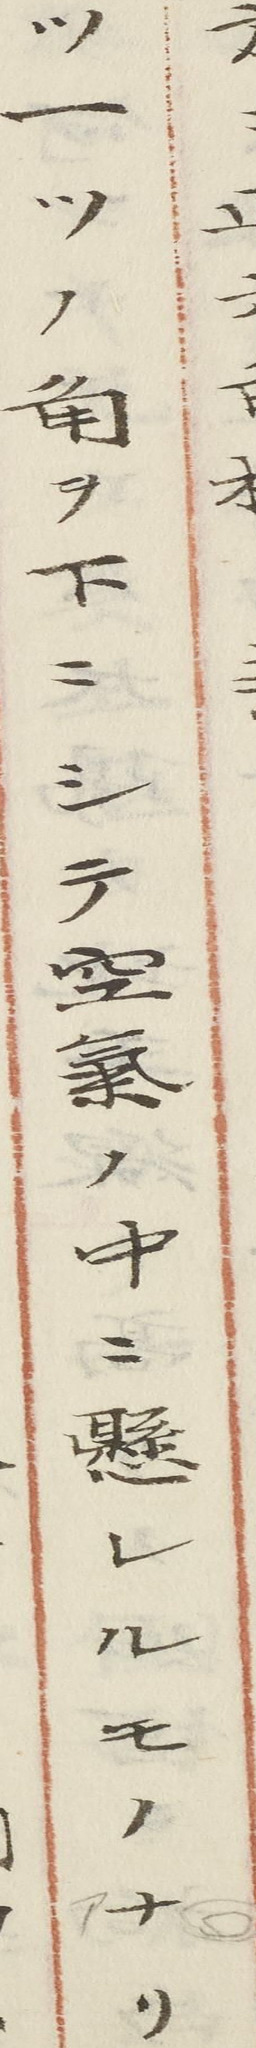ツ一ツノ角川ヲ下ニシテ空気ノ中ニ懸レルモノナリ
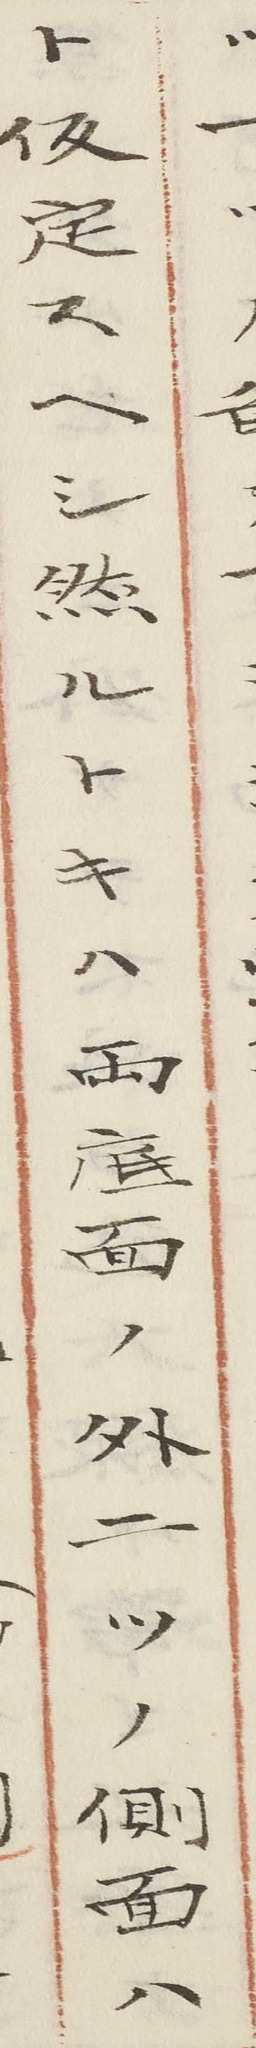ト仮定スヘシ然ルトキハ両底面ノ外ニツノ側面ハ
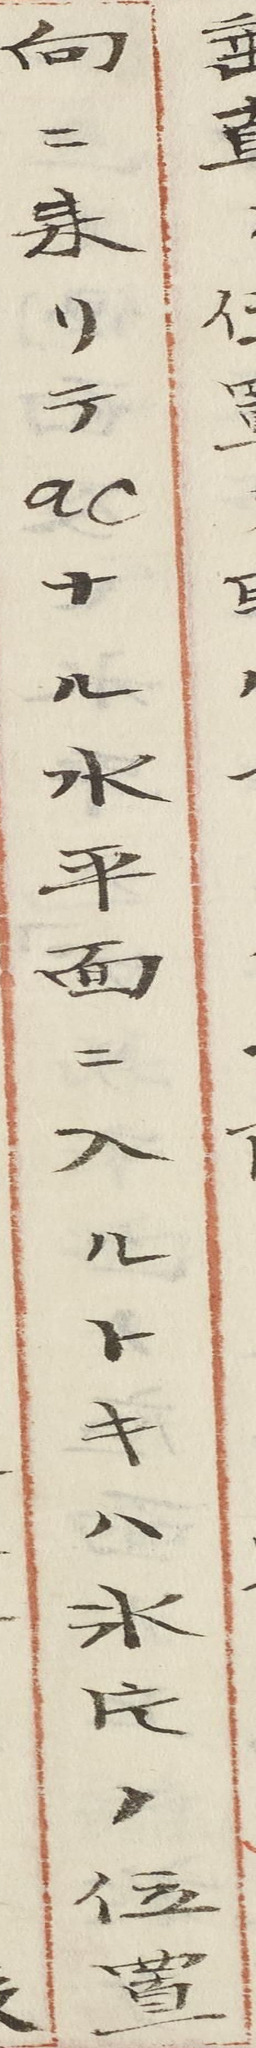向ニ来リテナル水平面ニ入ルトキハ氷片ノ位置
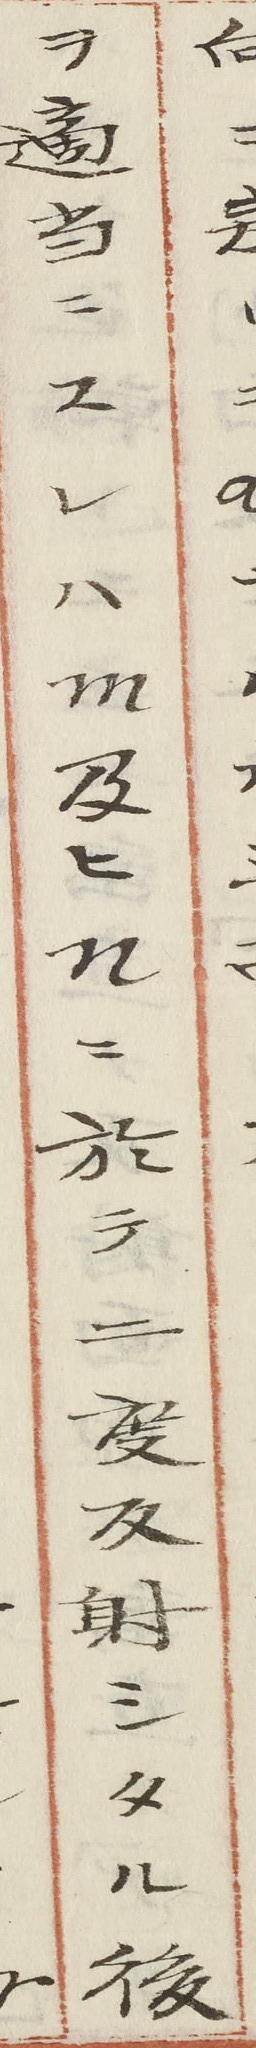ヲ適当ニスレハ及ヒニ於テ二度反射シタル後
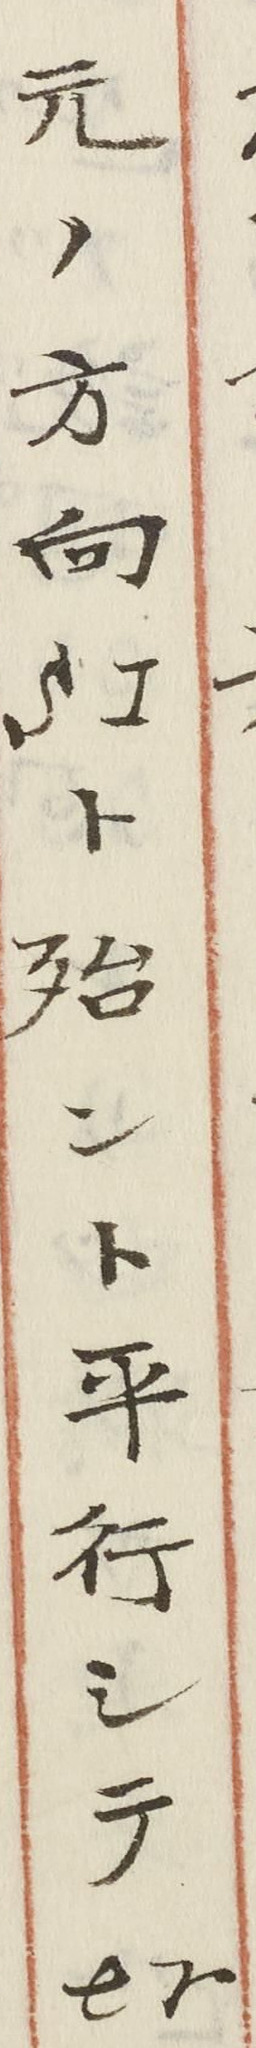第元ノ方向ト殆ント平行シテ
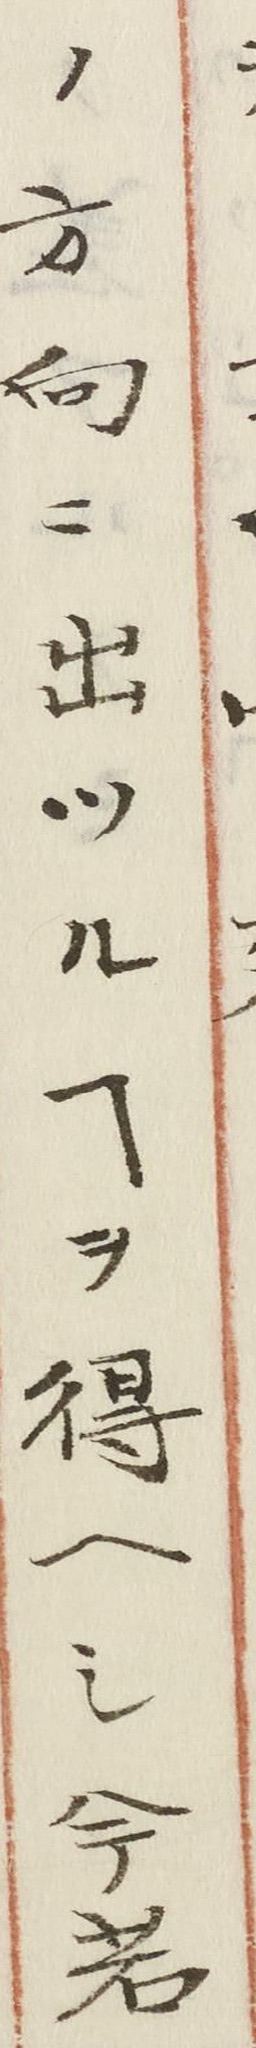十ノ方向ニ出ツルコトヲ得ヘシ今若
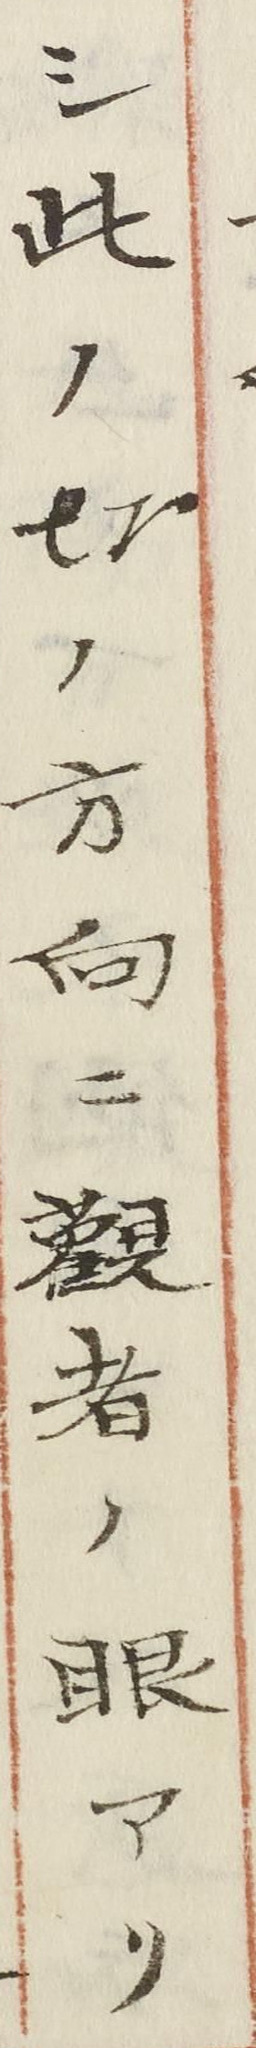図シ此ノノ方向ニ観者ノ眼アリ
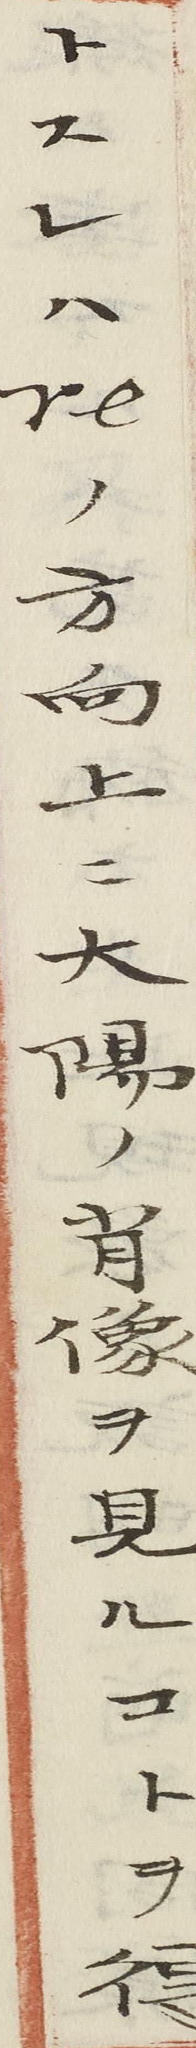トスレハノ方向ニ大陽ノ肖像ヲ見ルコトヲ得
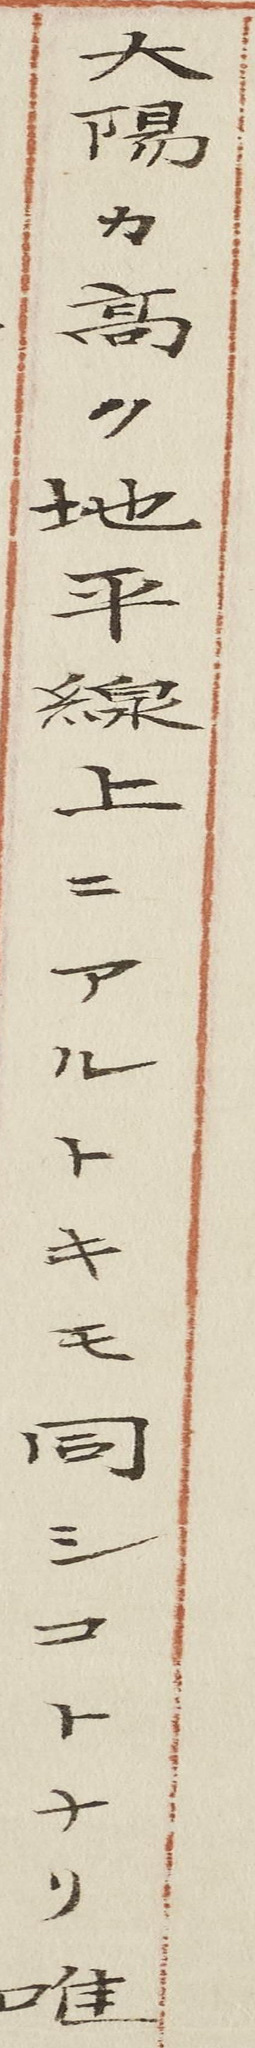大陽カ高ク地平線上ニアルトキモ同シコトナリ唯
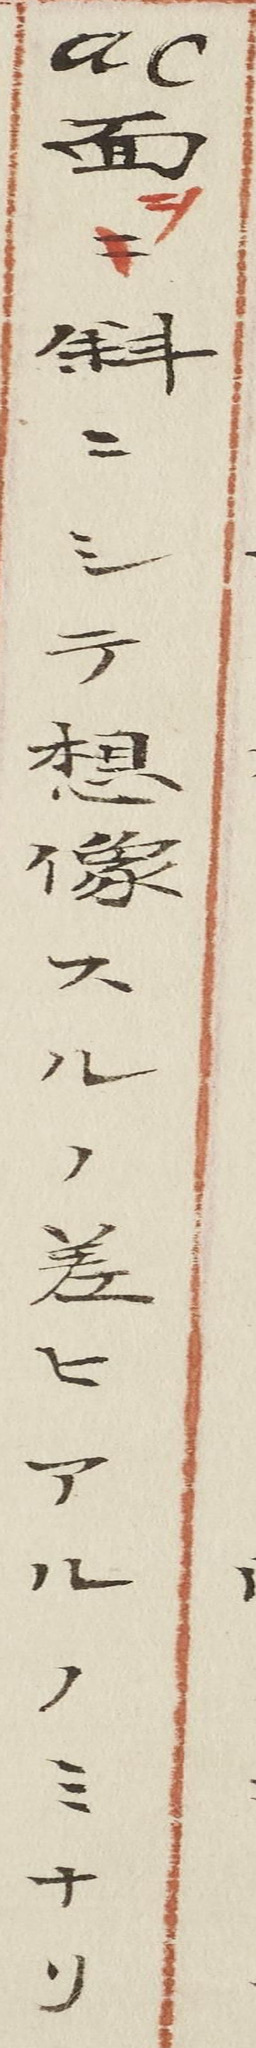面ヲ斜ニシテ想像スルノ差ヒアルノミナリ
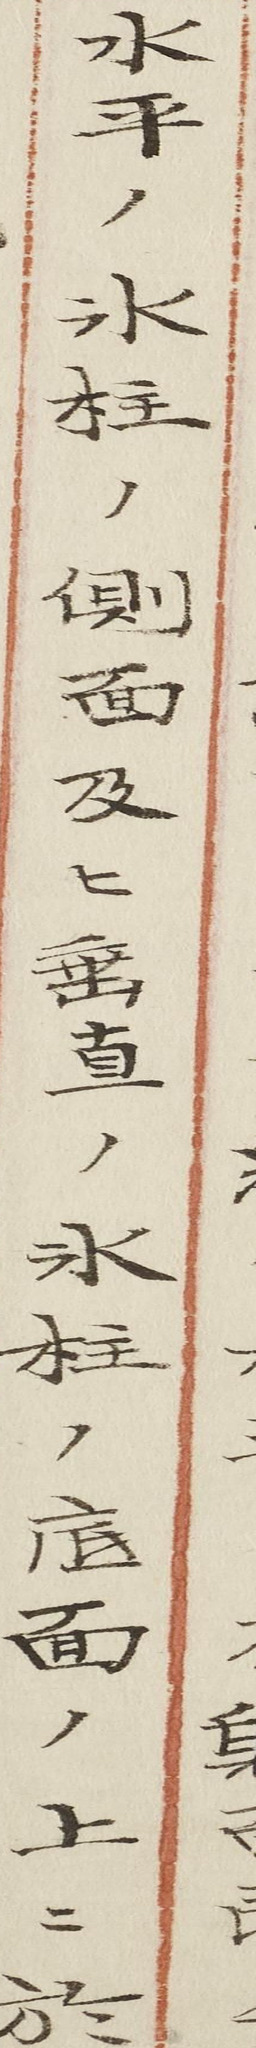水平ノ氷柱ノ側面及ヒ垂直ノ氷柱ノ底面ノ上ニ於
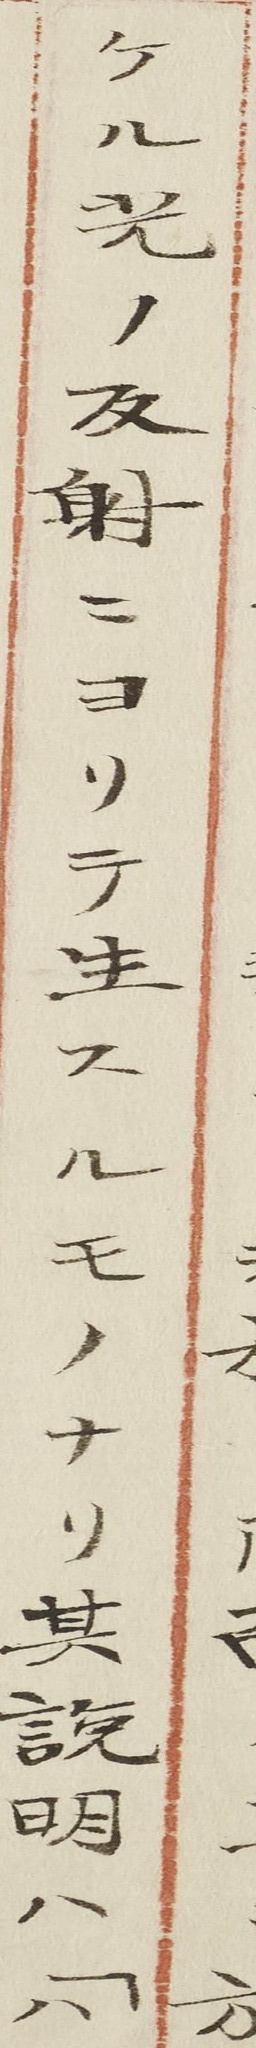ケル光ノ反射ニヨリテ生スルモノナリ其説明ハ「ハ
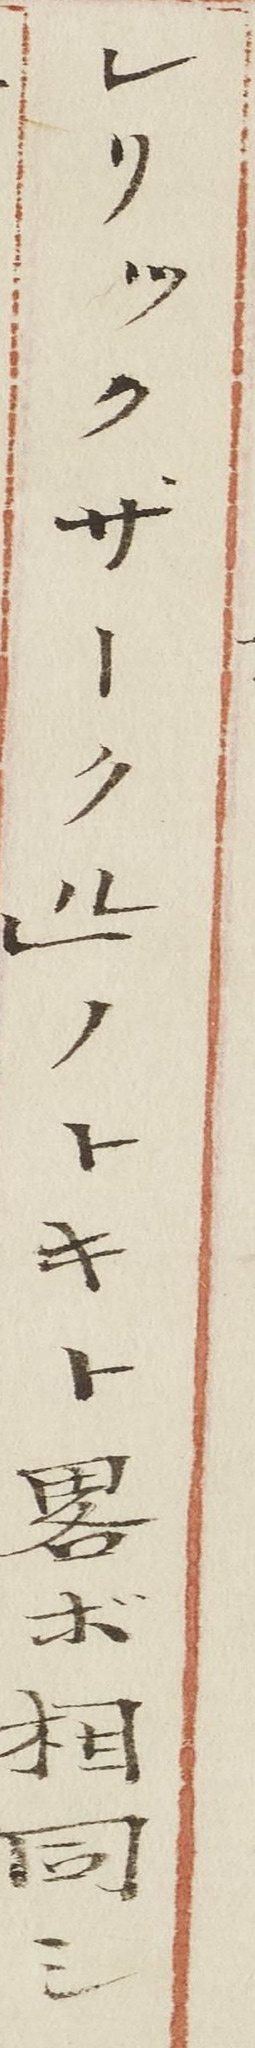レリック、サークル」ノトキト略ボ相同シ
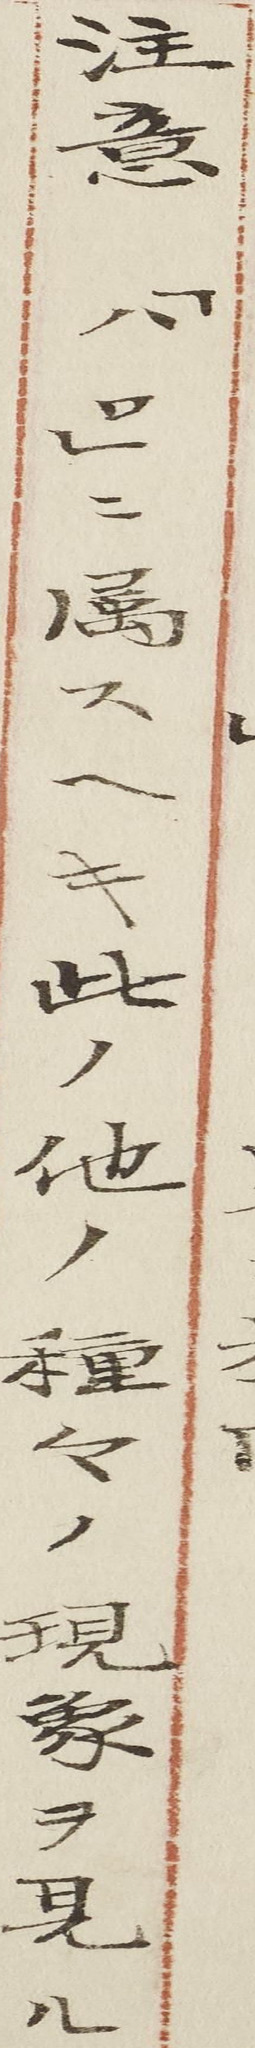注意「ハロ」ニ属スヘキ此ノ他ノ種々ノ現象ヲ見ル
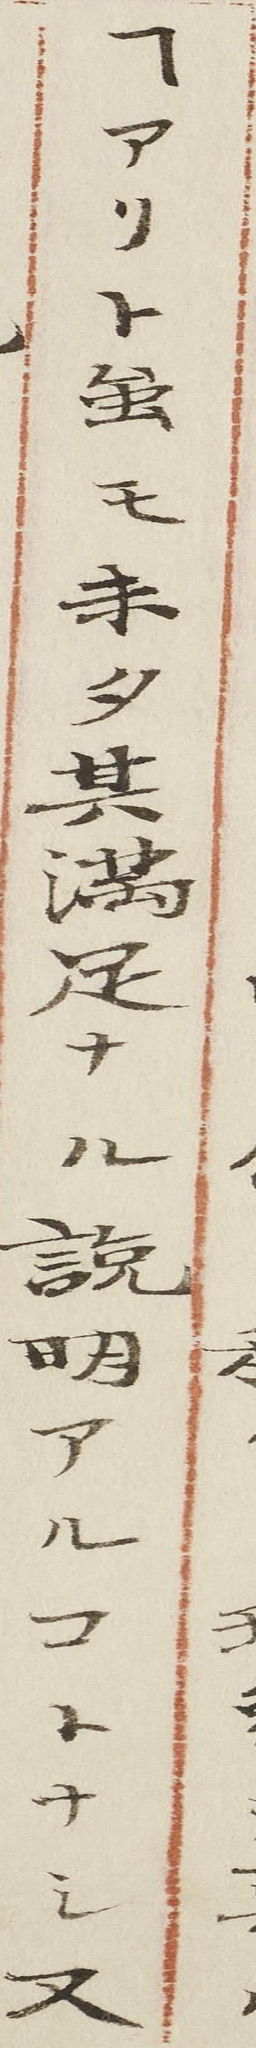コトアリト雖モ未タ其満足ナル説明アルコトナシ又
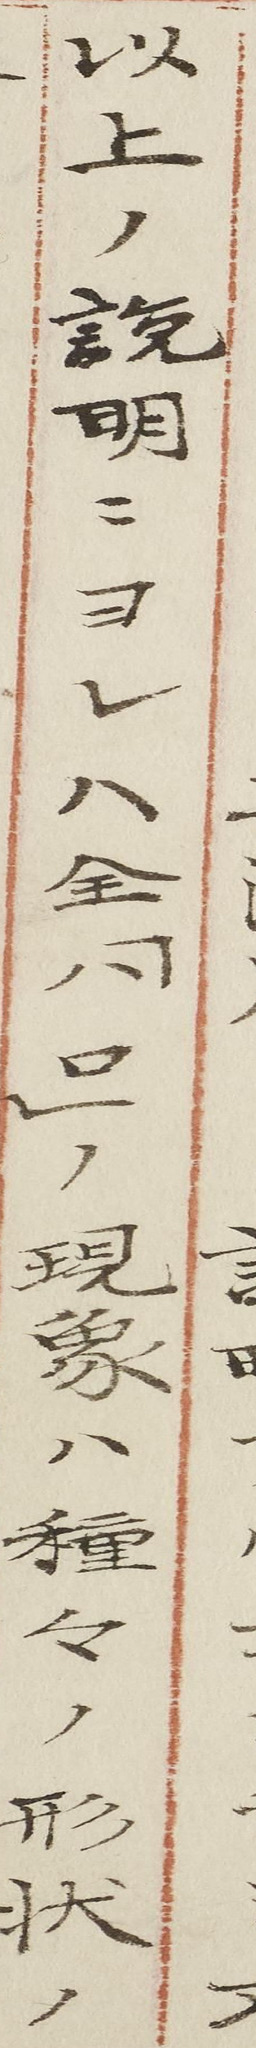以上ノ説明ニヨレハ全「ハロ」ノ現象ハ種々ノ形状ノ
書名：虹及ハロノ説明
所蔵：東京大学地震研究所図書室 Earthquake Research Institute Library, The University of Tokyo, JAPAN
